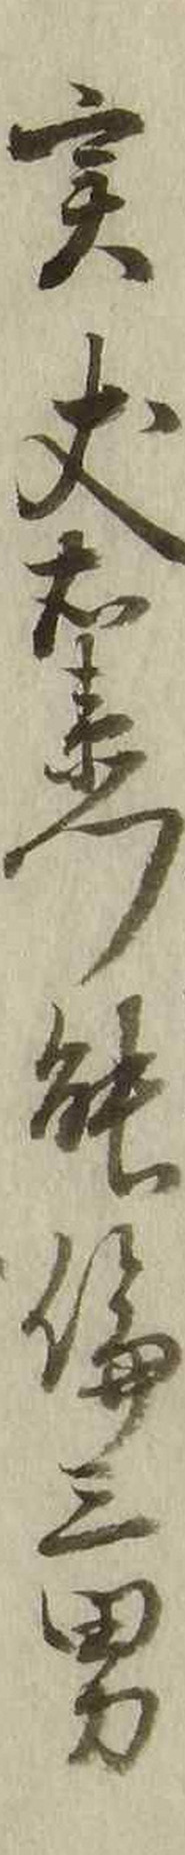実丈右衛門能倫三男
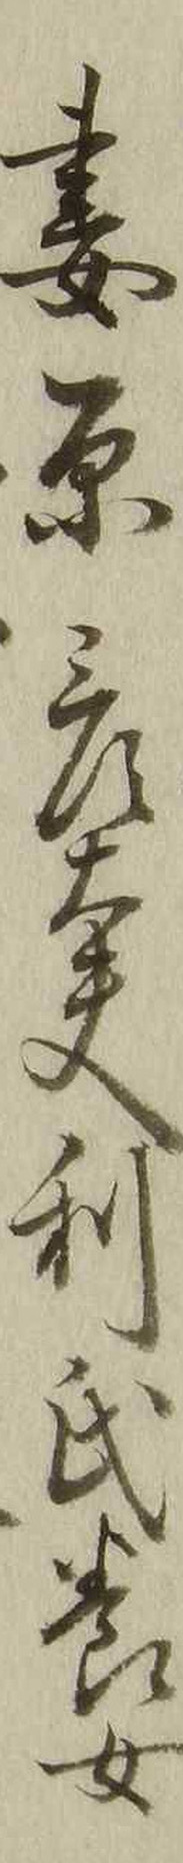妻原彦大夫利氏養女
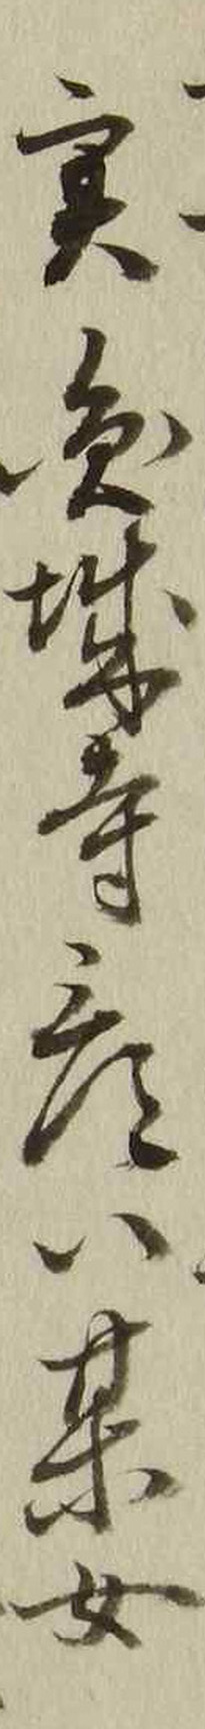実円城寺彦八某女
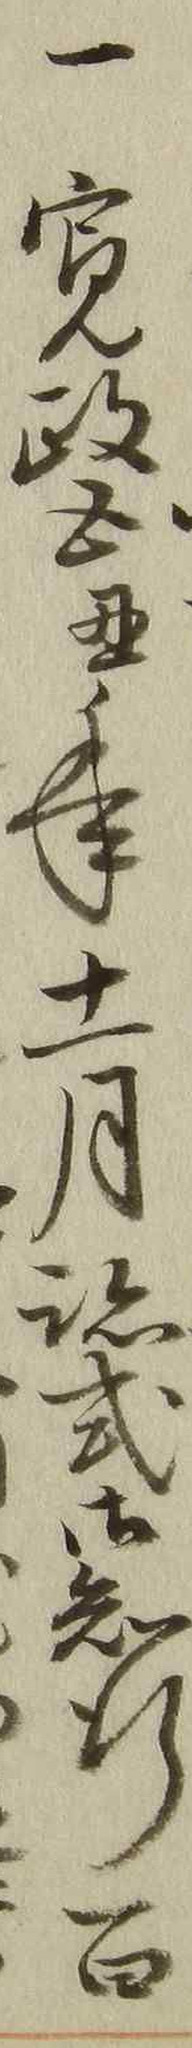一寛政五丑年十一月跡式御知行百
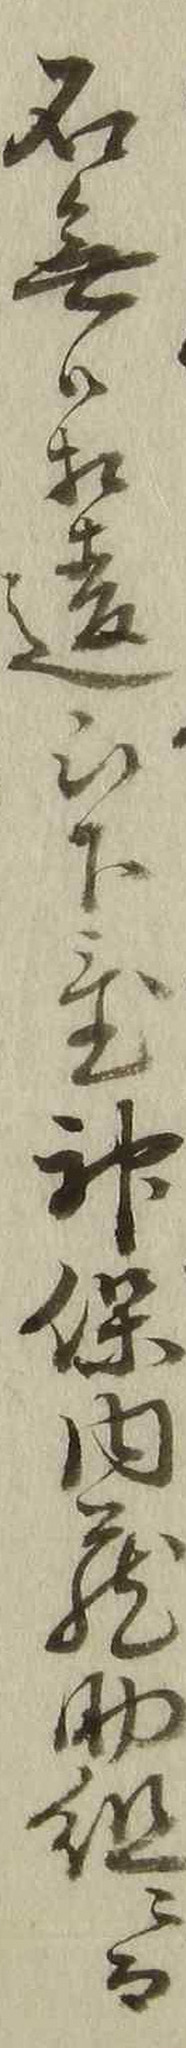石無御相違被下置神保内蔵助組ニ而
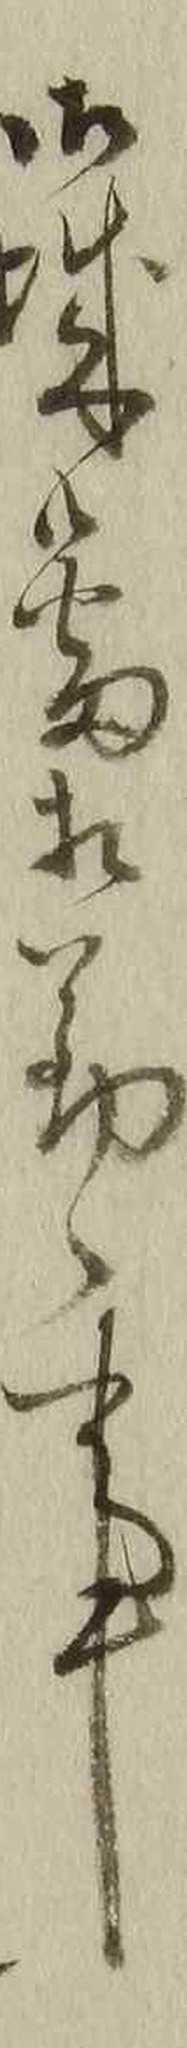御城御番相勤候事
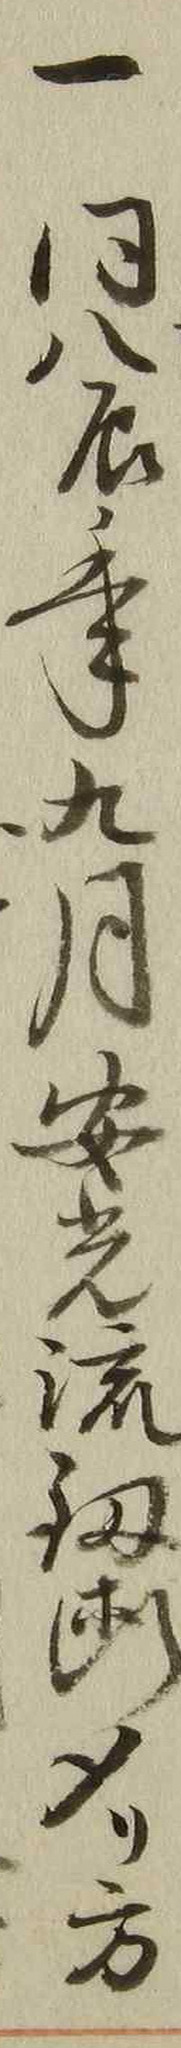一同八辰年九月安光流剣術〆り方
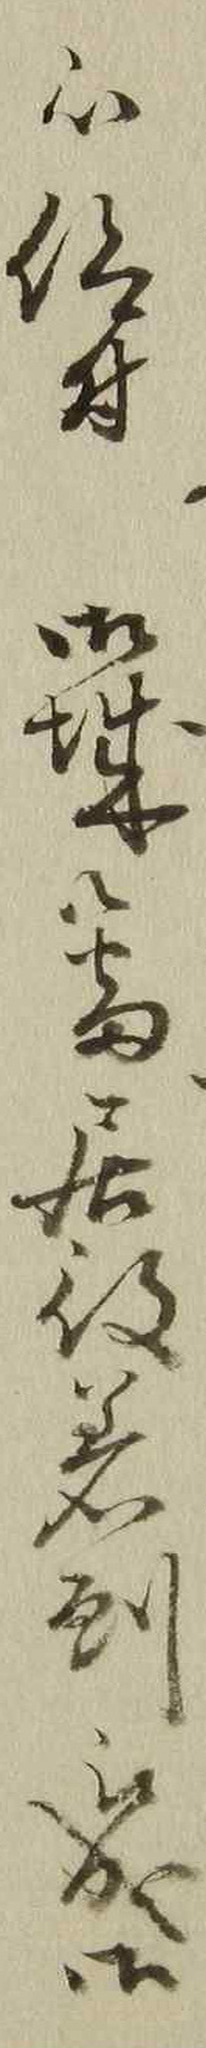被仰付御城御番居役着到被成御
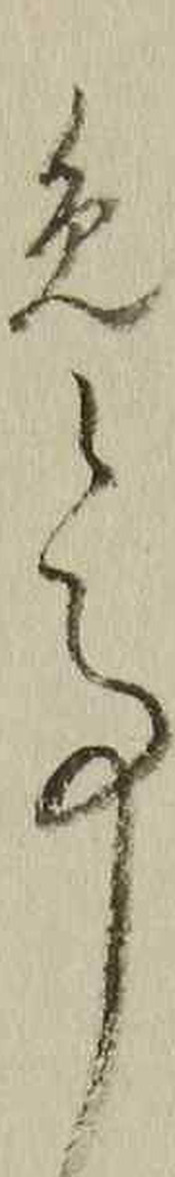免候事
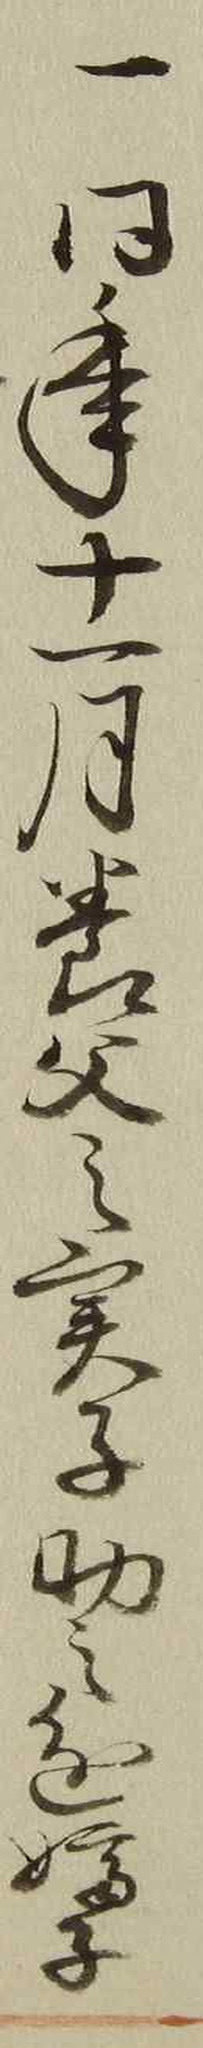一同年十一月養父之実子助之進嫡子
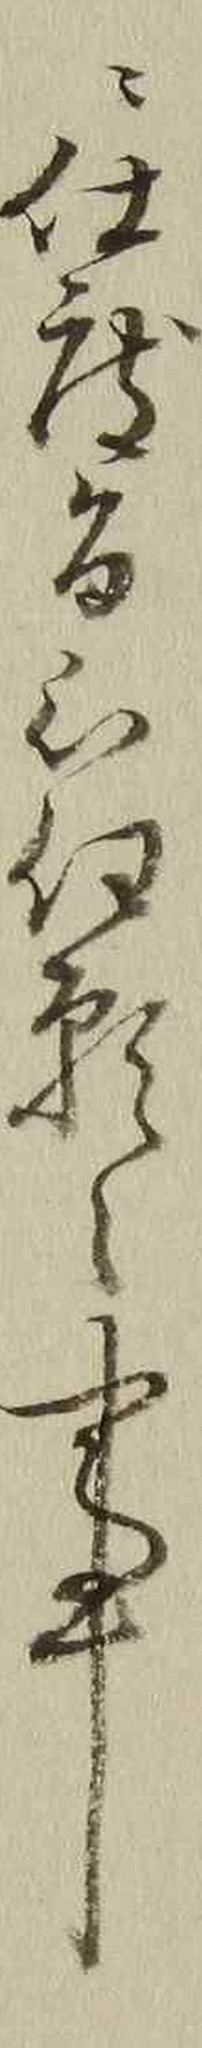ニ仕度旨被任願候事
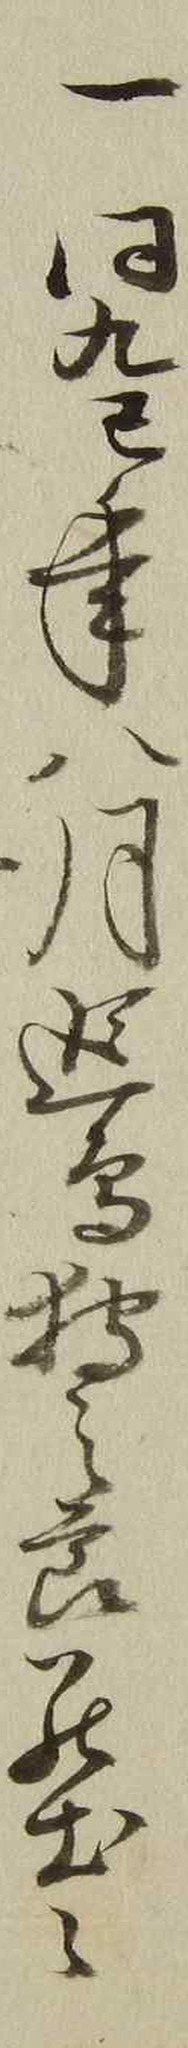一同九巳年八月追鳥狩之節罷出候
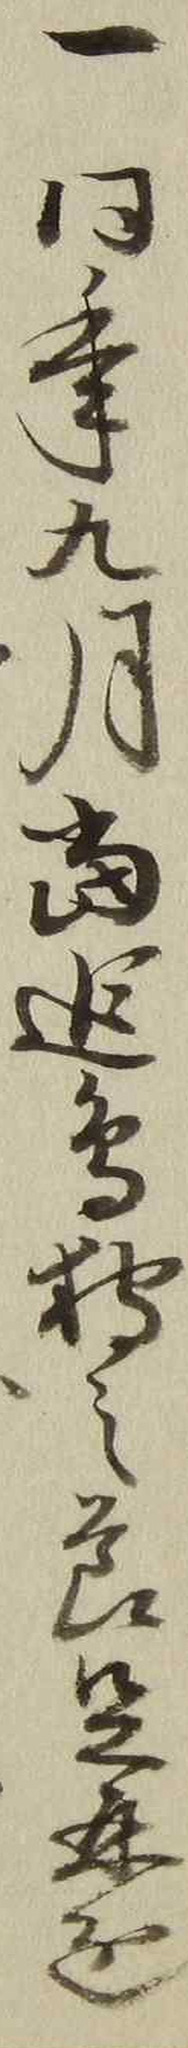一同年九月当追鳥狩之節足再進
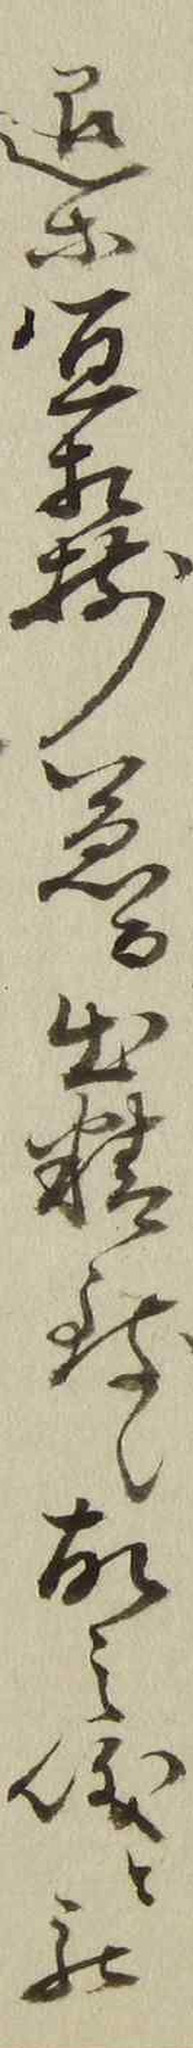退登宜相揃兼而出精致候故之儀と被
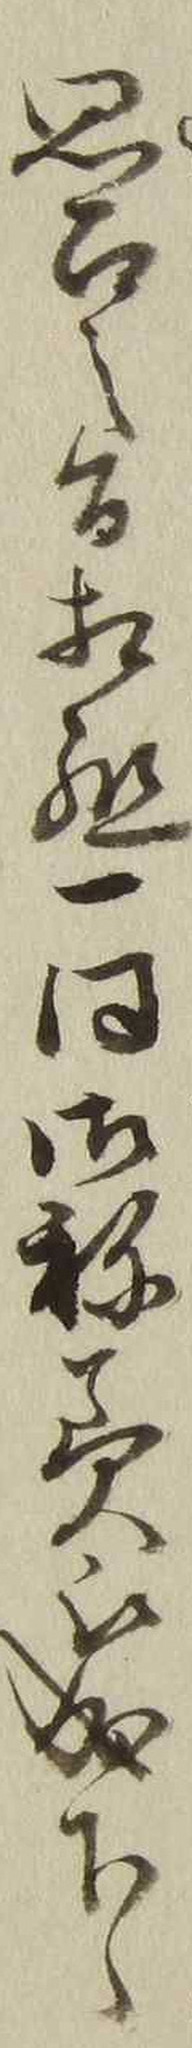思召之旨相組一同御称美被成下候
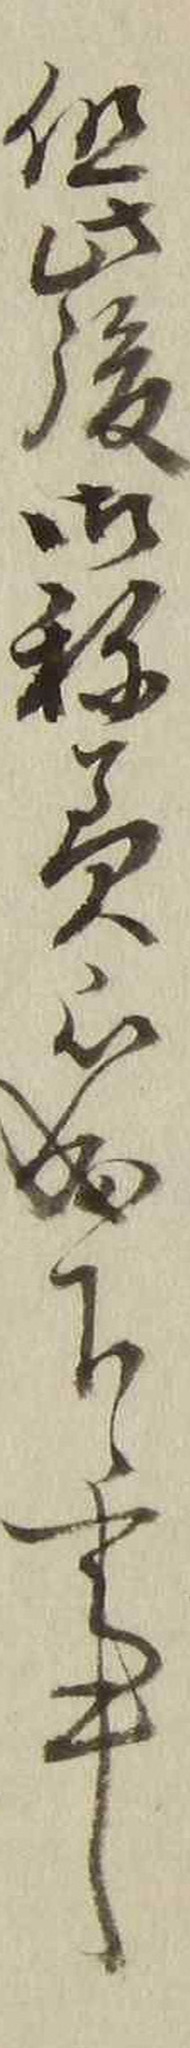但此後御称美被成下候事
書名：諸士系譜　巻之53　に之部4
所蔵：会津若松市立会津図書館
